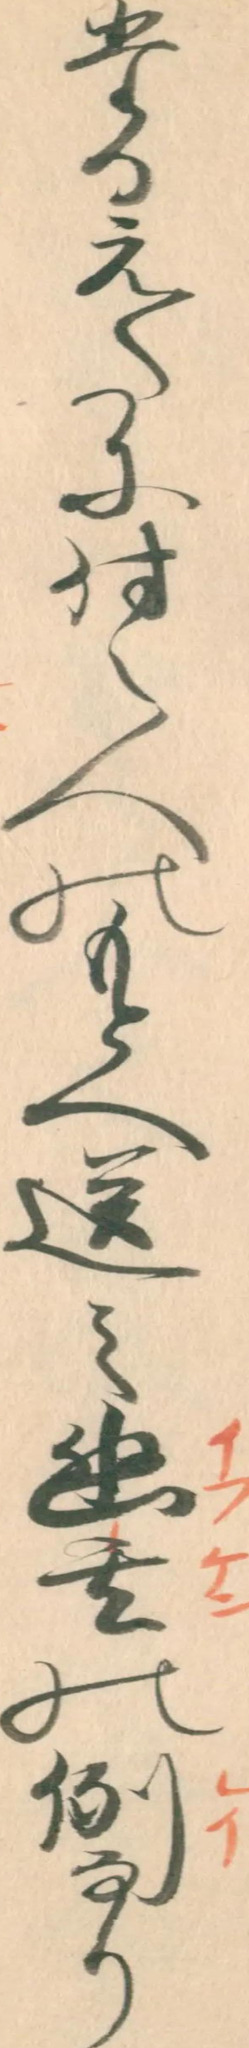たるえくつに付人のもとへ送之幽玄の例なり
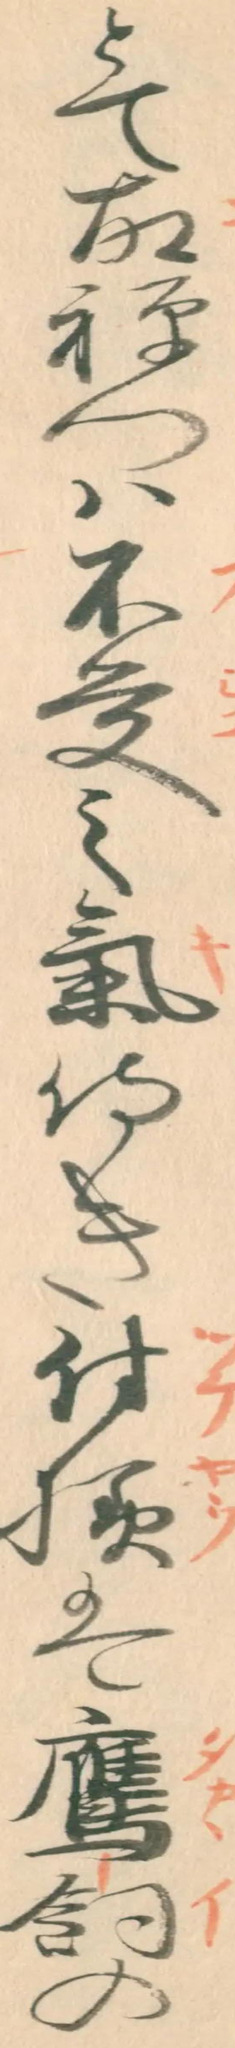とて左様つは不受之氣侍き付様にて鷹飼の
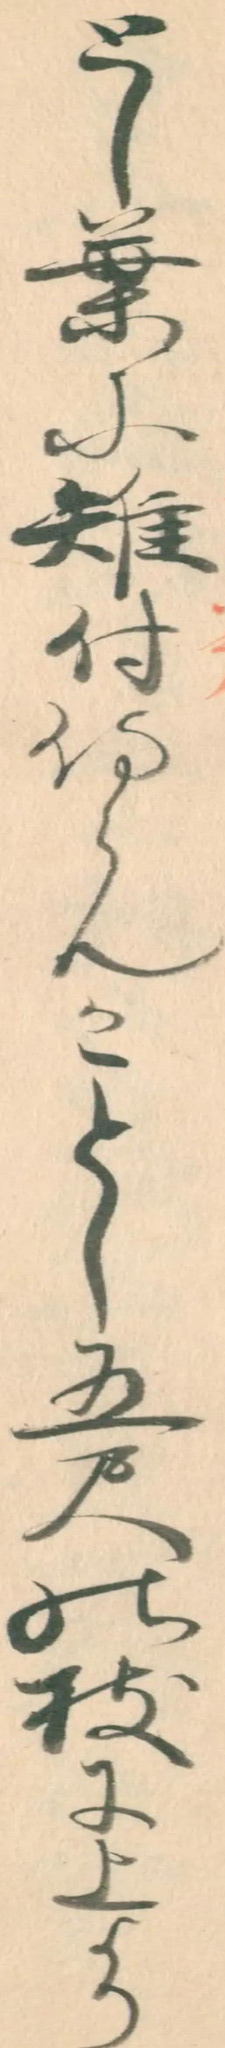とし葉に雉付侍らんことし五尺の枝に上より
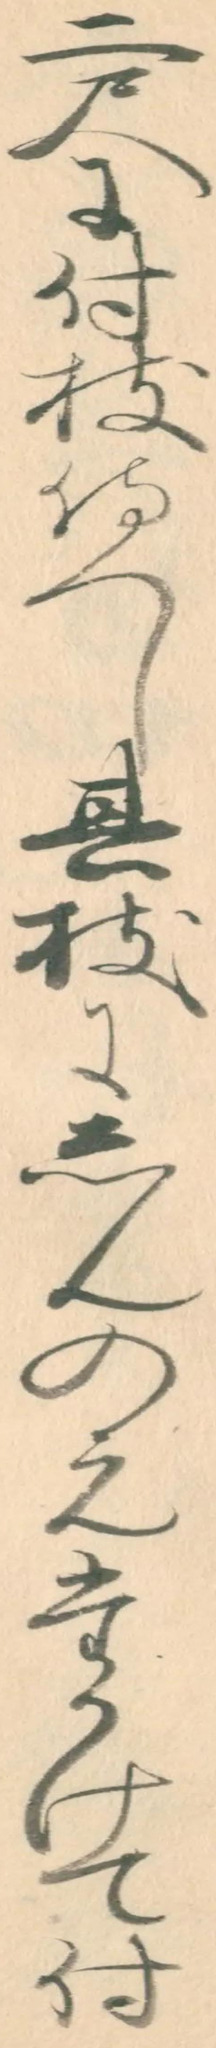二尺に付枝侍へし其枝にしんのえたかけて付
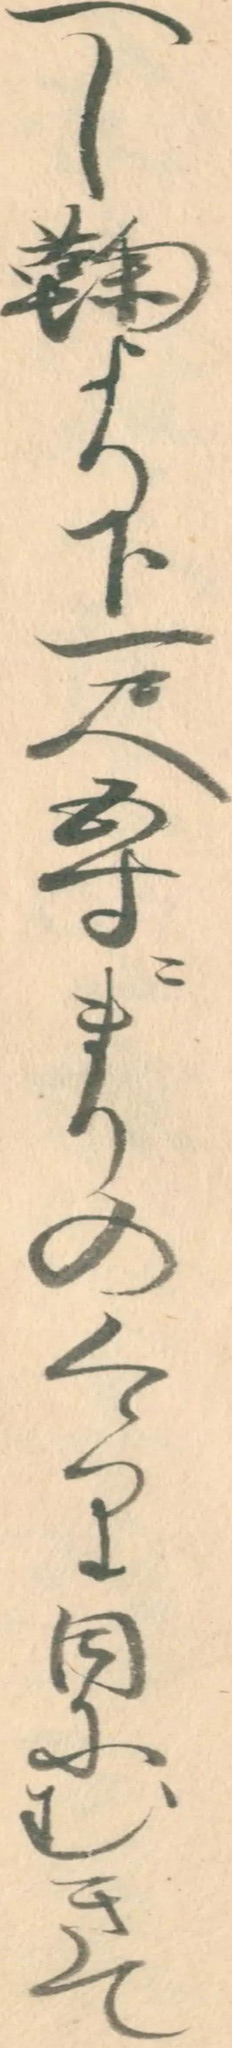へし鞠より下一尺五寸にまりのくゝり目にむきて
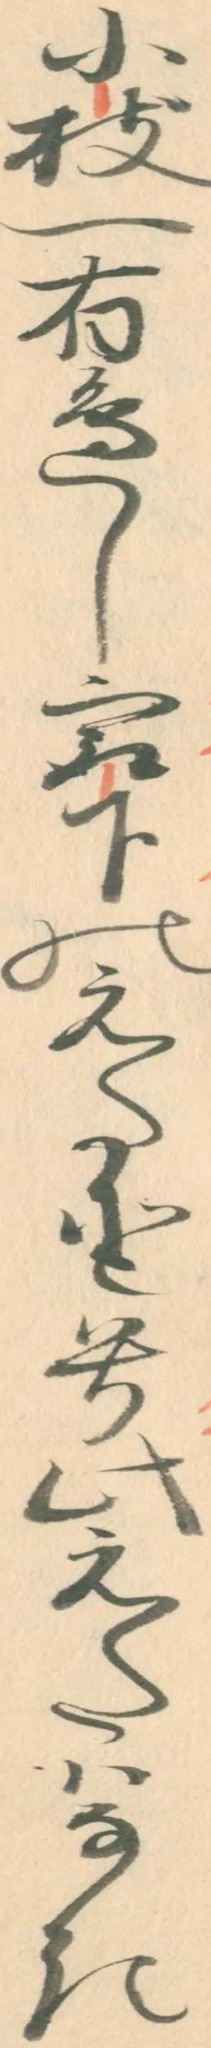小枝一有かへし最下のえたを此此えたはなき

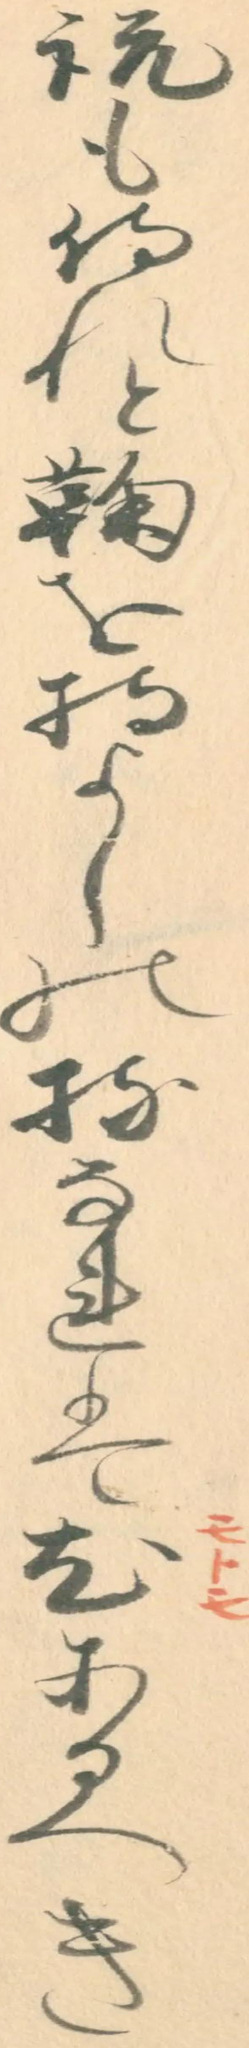説も侍れと鞠を持よしの持なれにて尤ありへき
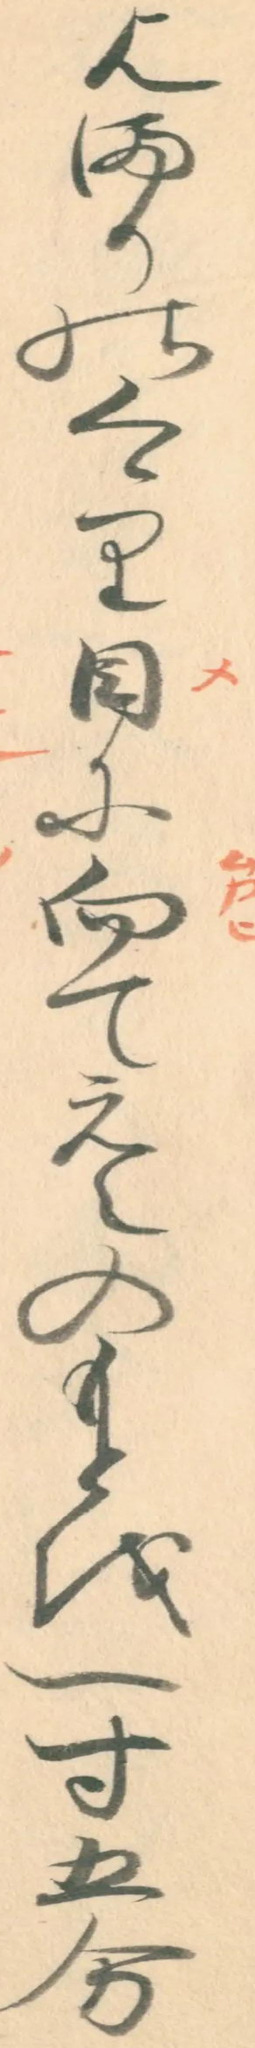はまりのくゝり目に向てえのもとを一寸五分
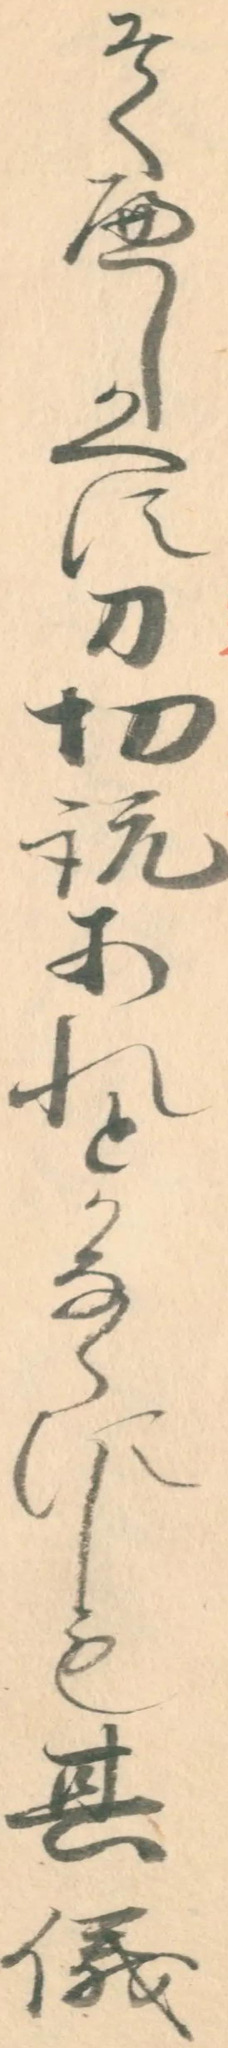そくへしうへに刀切説あれとかならすしも其儀
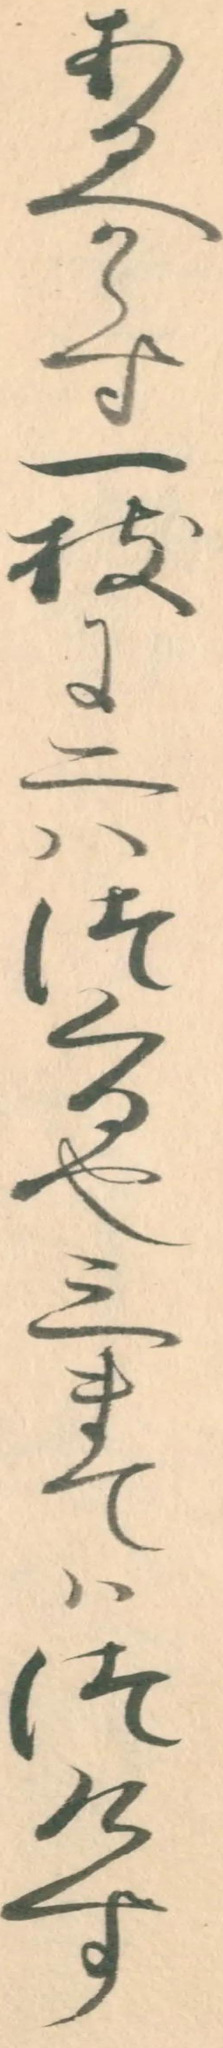あるへからす一枝に二はつくる也三まてはつけす
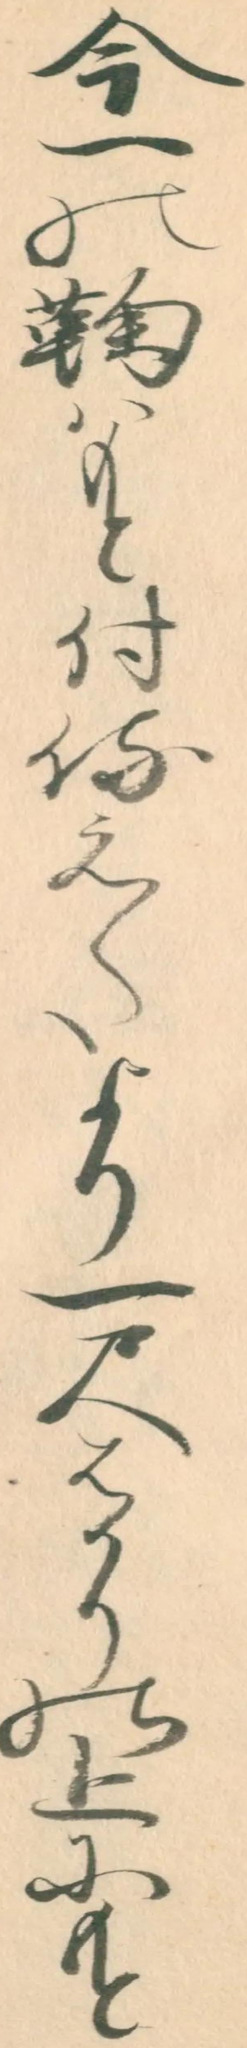今一の鞠なと付侍えたより一尺はかりの上にもと
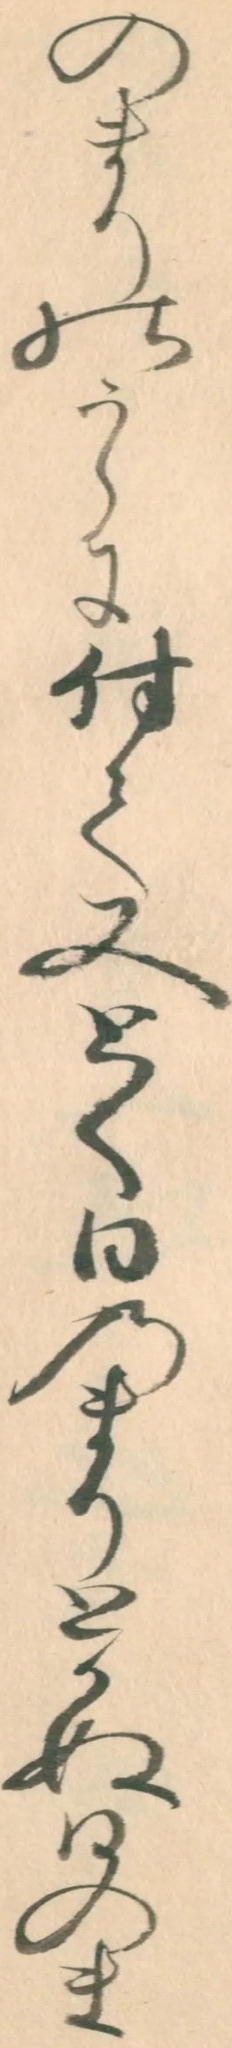のまりのうらに付て又とく日のまりとかぬ日のま
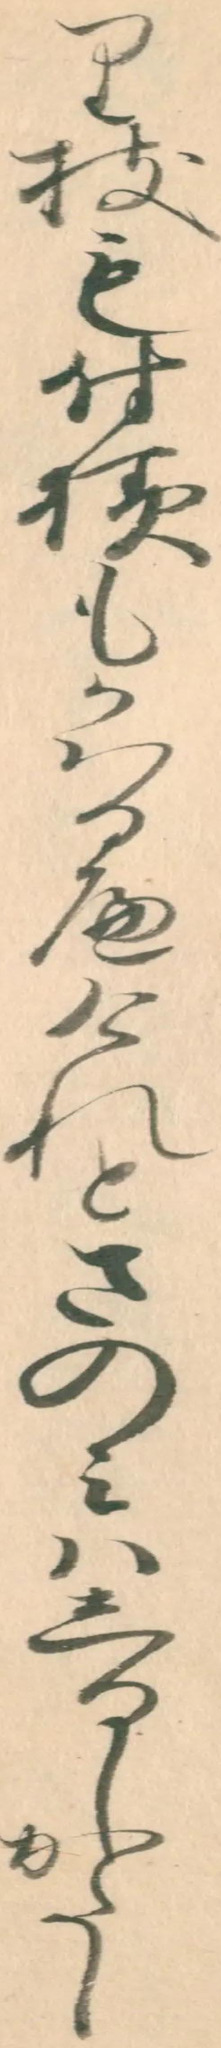り枝も付様もかはるへけれとさのみはくしるしかたし
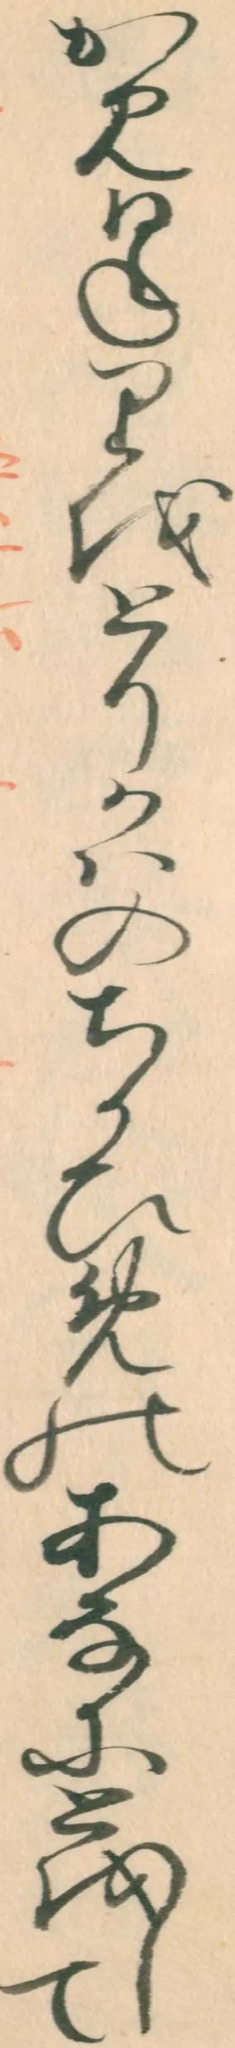かみひねりをとりかはのちかひめのあなにとをして
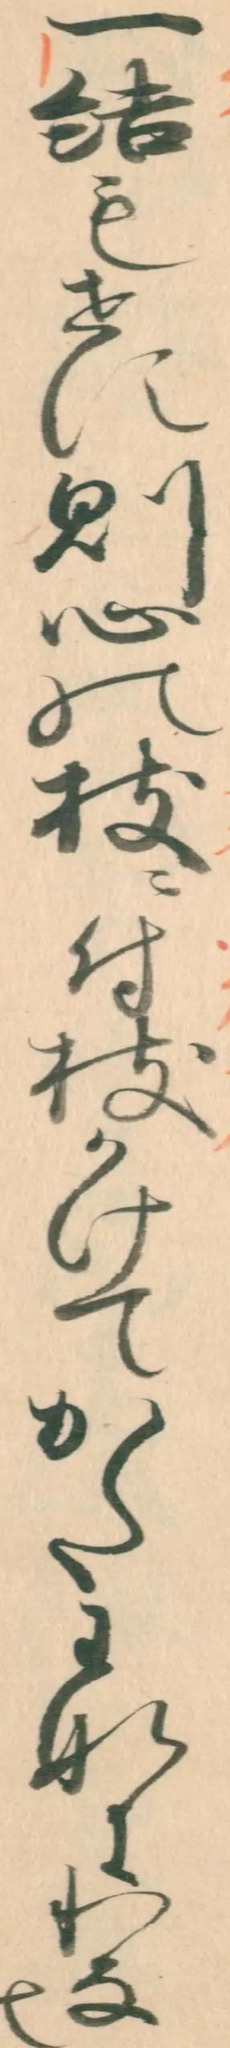一結もせす則心の枝に付枝かけてかたになにわなの
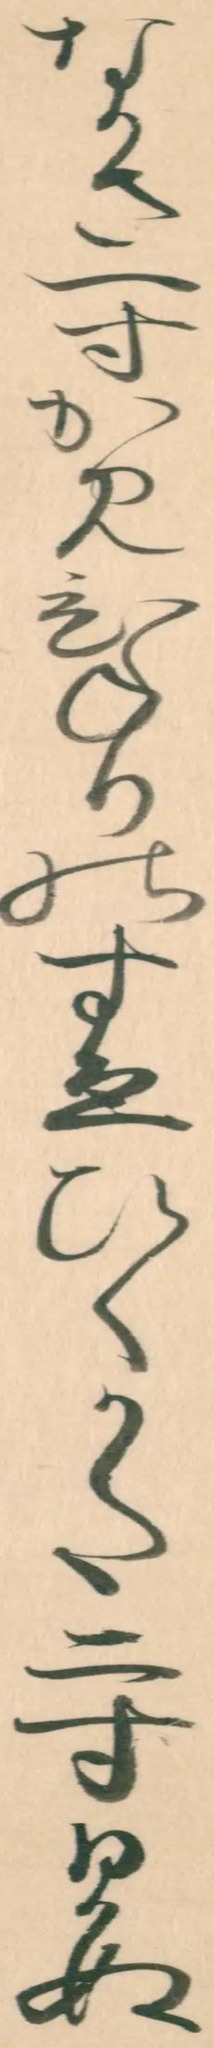なかさ一寸かみひねりのすゑひくかた二寸ひかぬ
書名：遊庭秘抄 2巻. [1]
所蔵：国立国会図書館 National Diet Library, JAPAN
